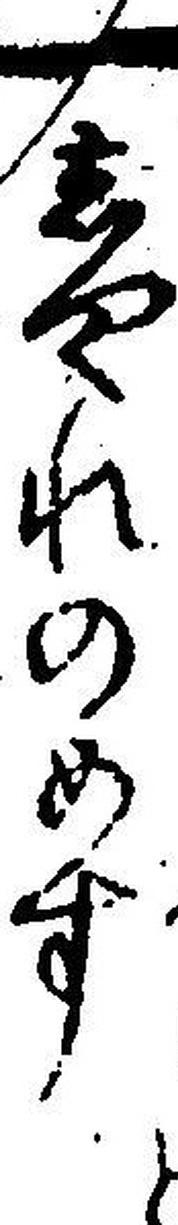しやれのめす

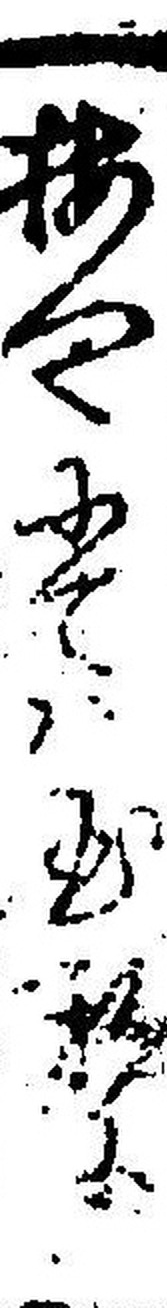梅やにては玉新に
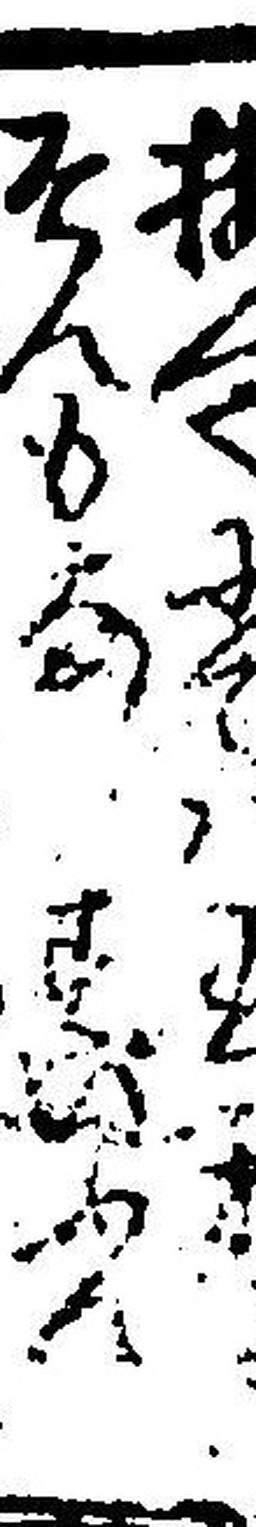そんもなしすいふん
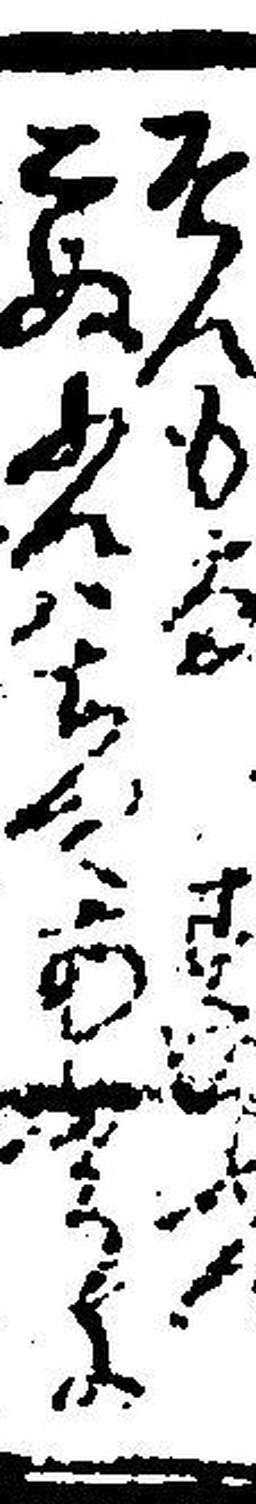こぬふんはちやあふうに
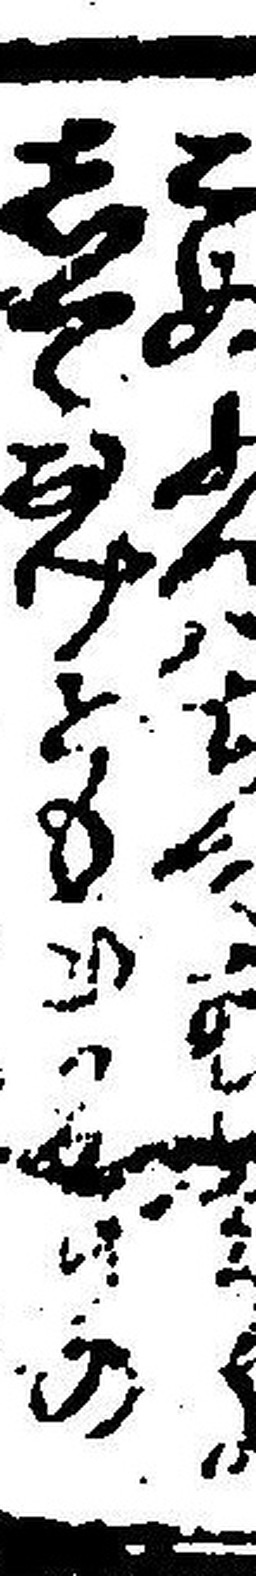しておけともま事の
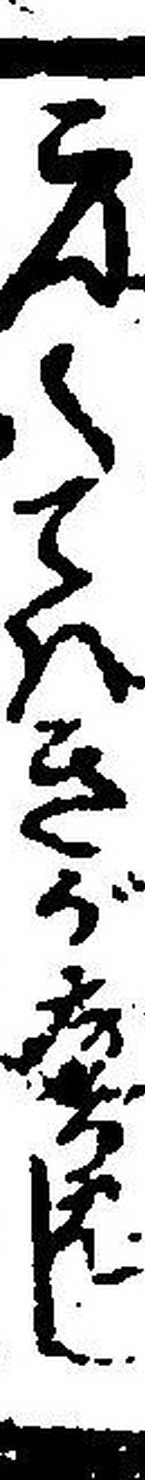こん〳〵てはきがなかばし
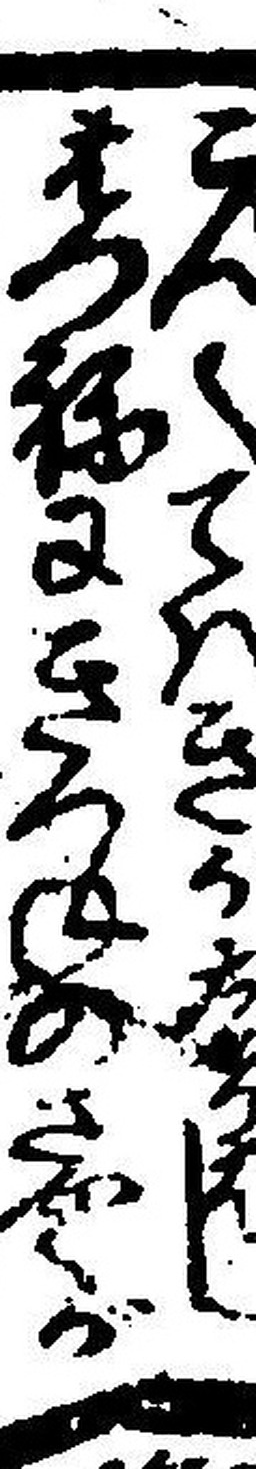はつねにきつねのきやくが
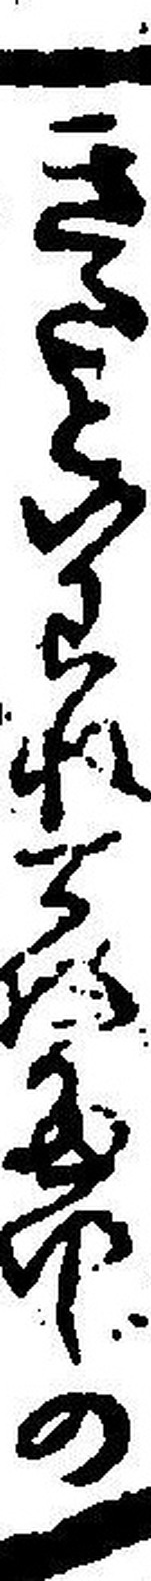きたといわれてはたいじの
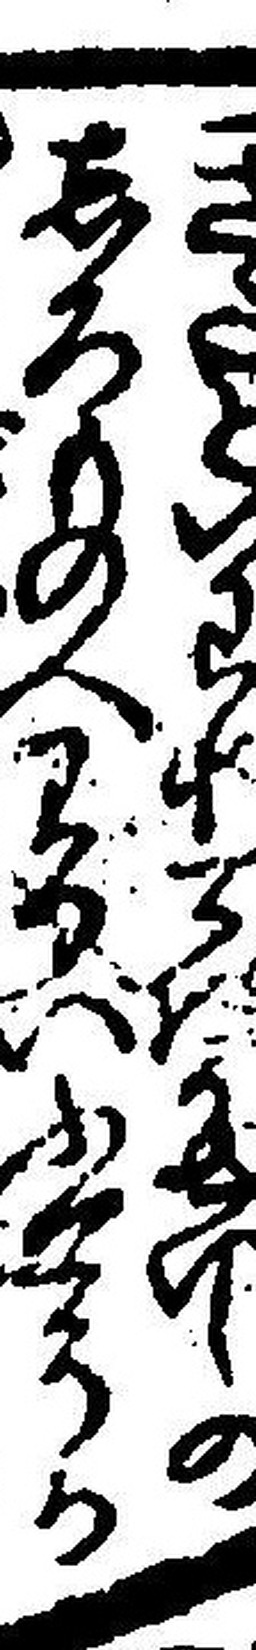しろものへわるいふてうか
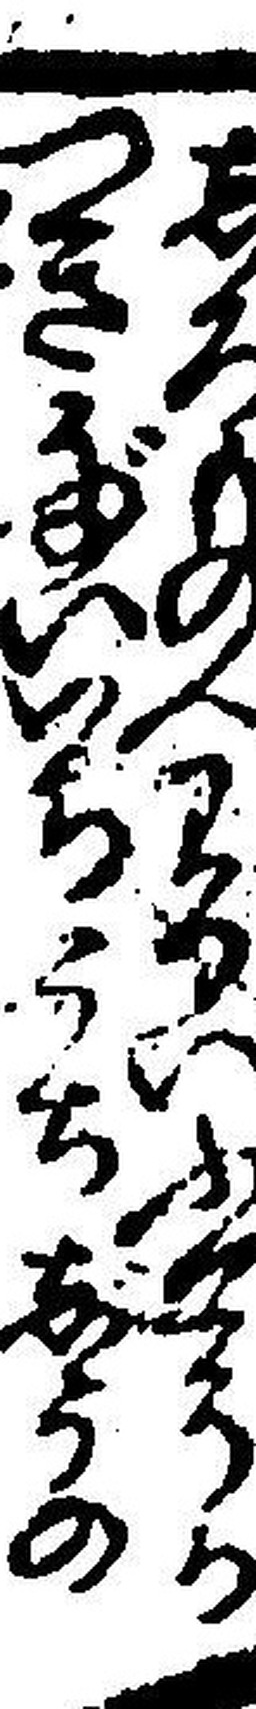つきだいいちうちじうの
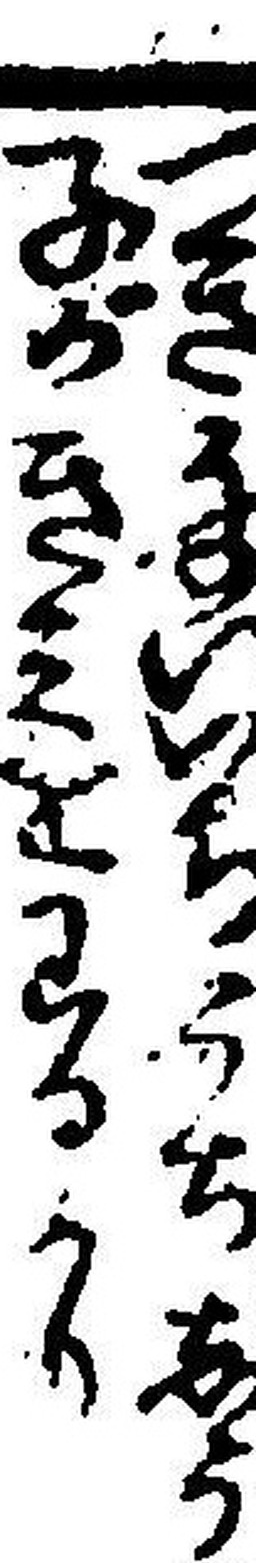子がきみをわるかり
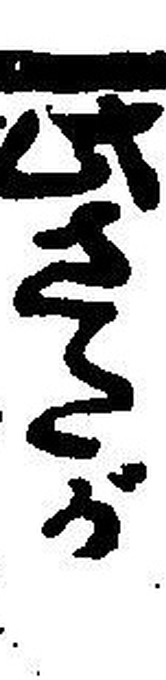此さたが
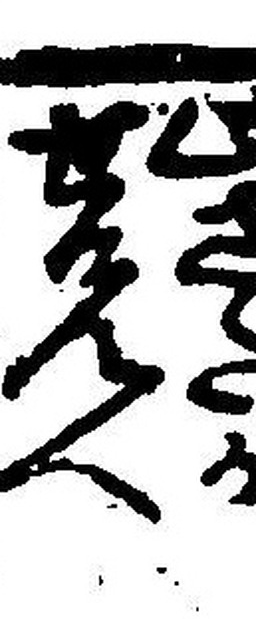せけんへ
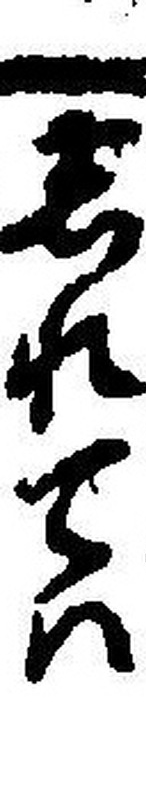しれては
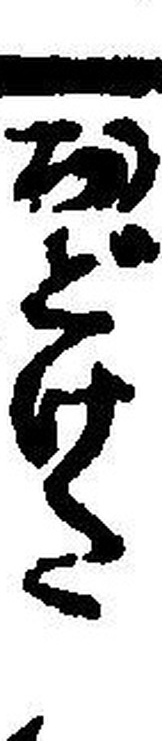おどけた
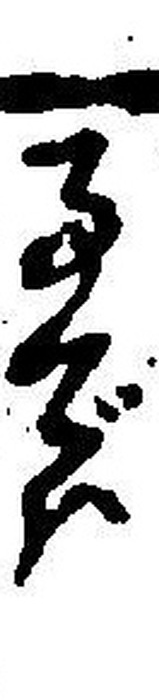事では
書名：間違狐之女郎買 / 市場通笑作
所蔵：東京大学総合図書館 General Library in the University of Tokyo, JAPAN
